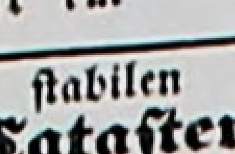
stabilen
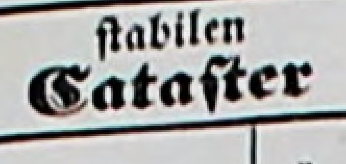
Cataster
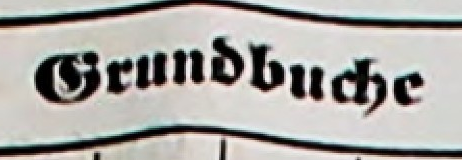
Grundbuche
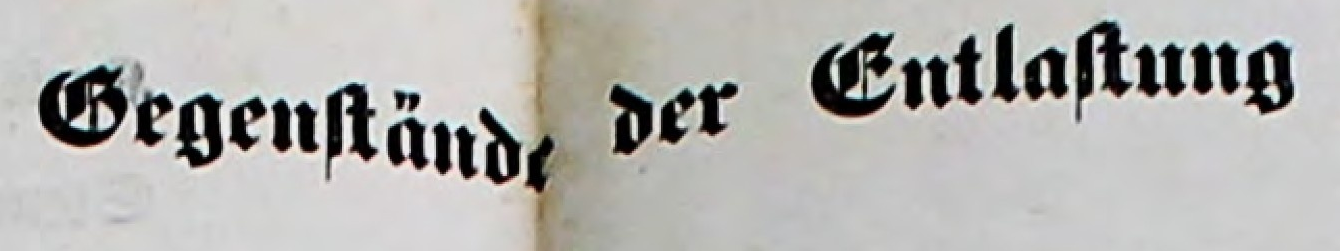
Gegenstände der Entlastung
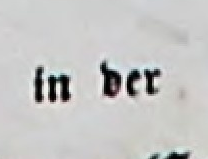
in der
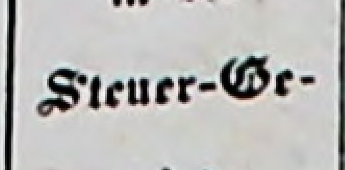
Steuer-Ge-
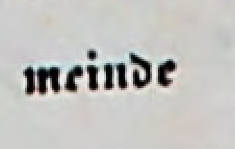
meinde
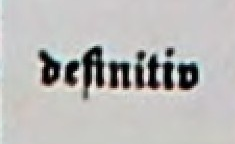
definitiv
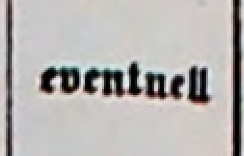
eventuell
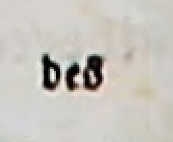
des
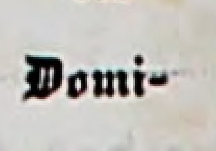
Domi-
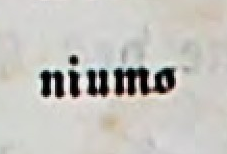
niums
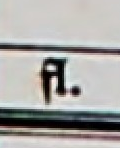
fl.
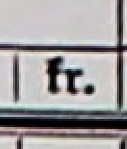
kr.
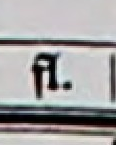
fl.
